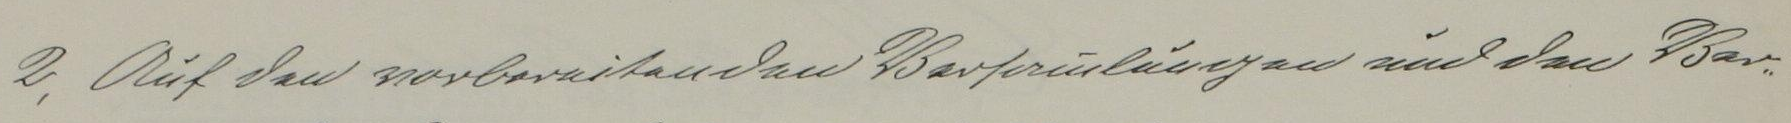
2. Auf den vorbereitenden Versammlungen und den Ver-
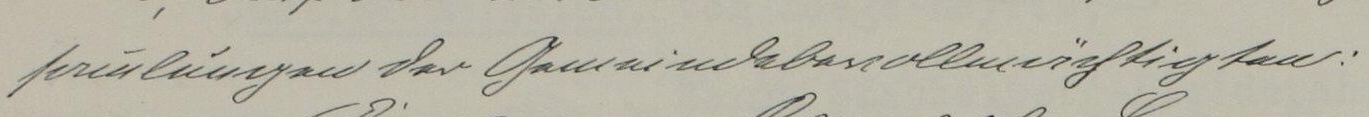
sammlungen der Gemeindebevollmächtigten:
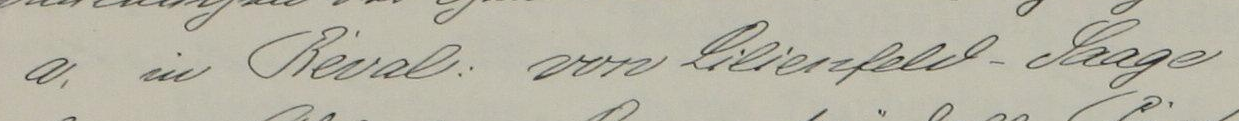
a. in Reval: von Lilienfeld-Saage
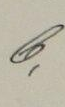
b.
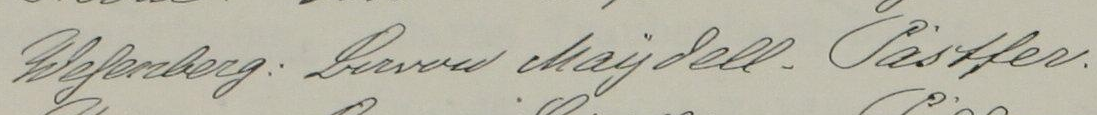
Wesenberg: Baron Maydell-Pastfer.
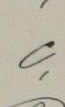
c.
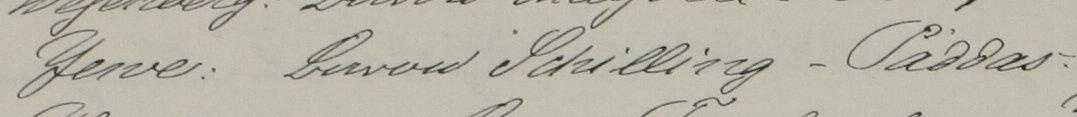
Jewe: Baron Schilling-Paddas.
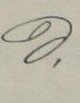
d.
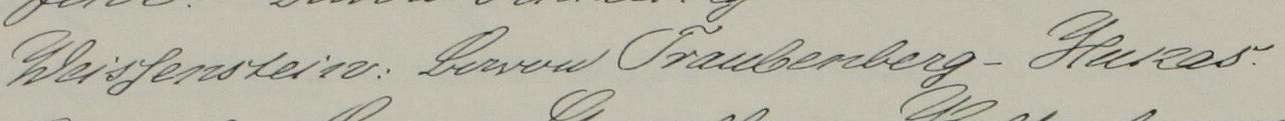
Weissenstein: Baron Traubenberg-Hukas.
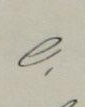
e.
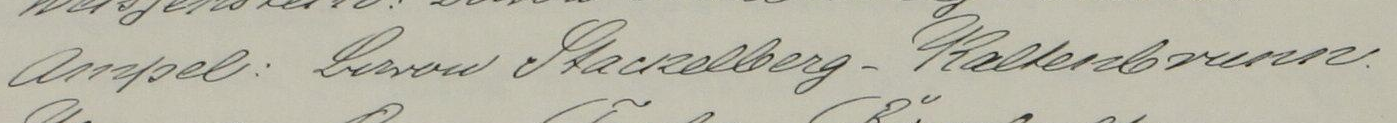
Ampel: Baron Stackelberg-Kaltenbrunn.
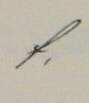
f.
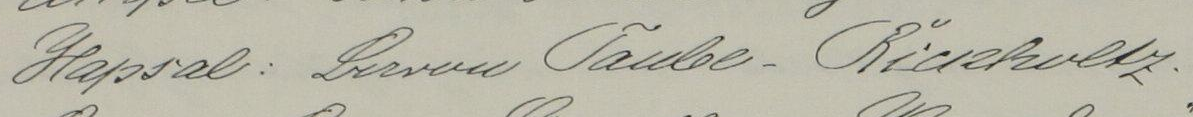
Hapsal: Baron Taube-Rickholtz.
